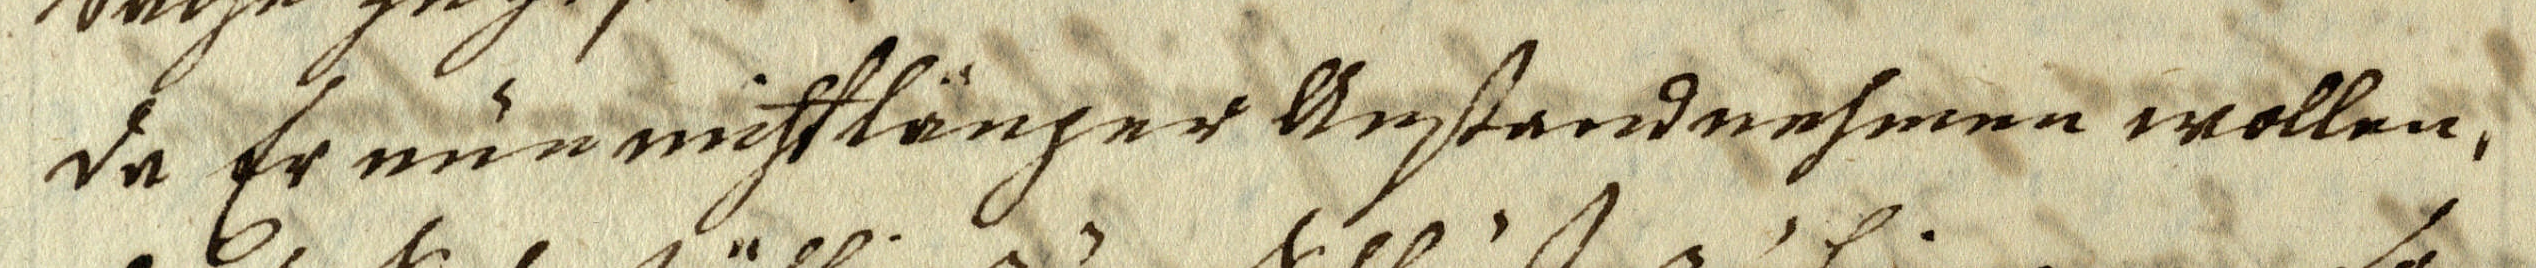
Da Er nun nicht länger Anstand nehmen wollen,
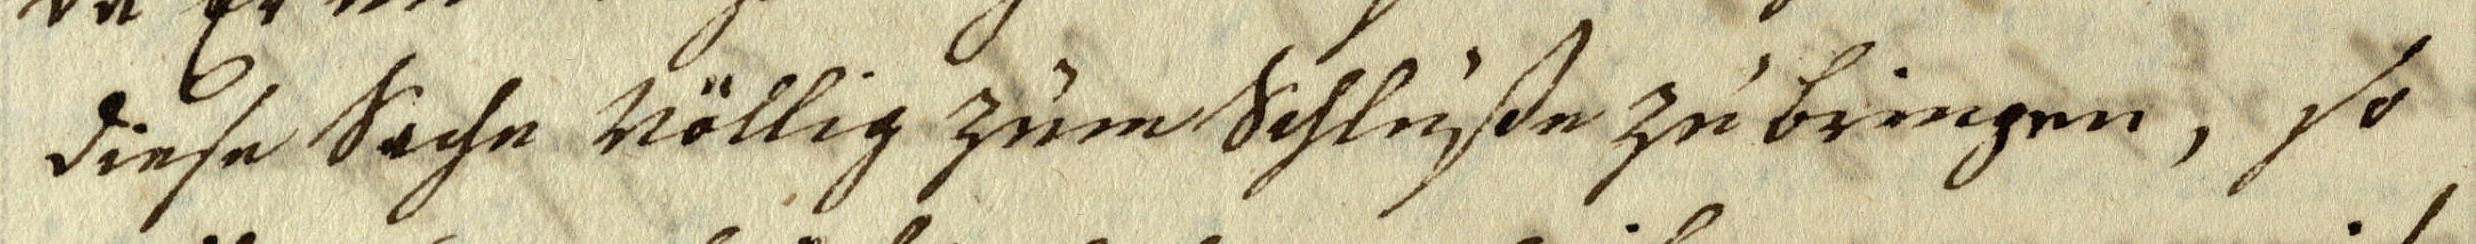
diese Sache völlig zum Schluße zu bringen, so
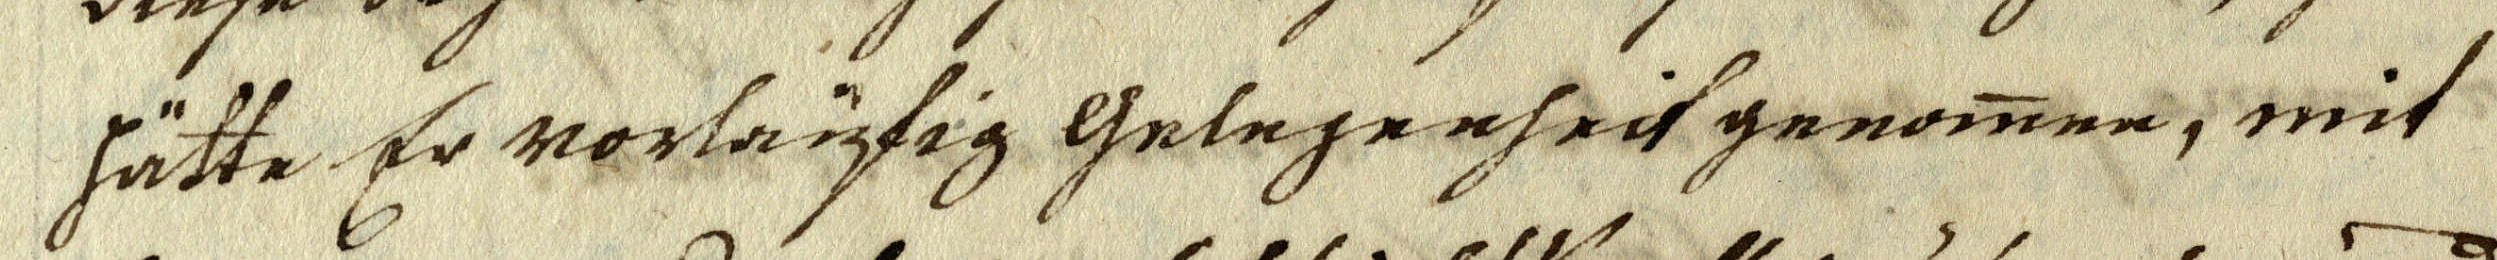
hätte Er vorläufig Gelegenheit genomen, mit
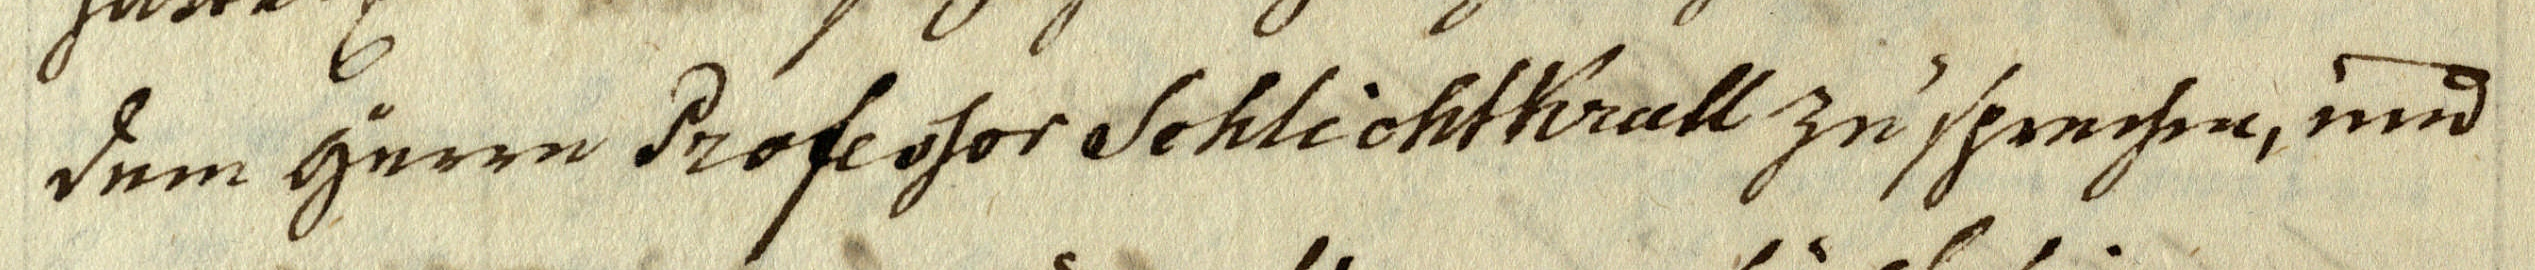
dem Herrn Professor Schlichtkrull zu sprechen, und
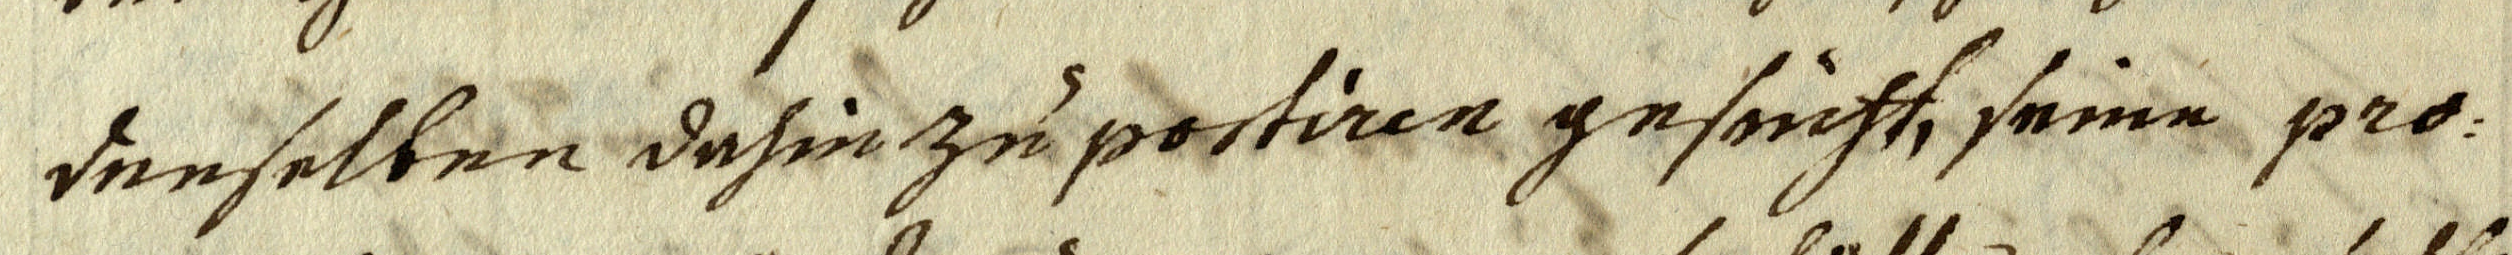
denselben dahin zu portiren gesucht, seine pro¬
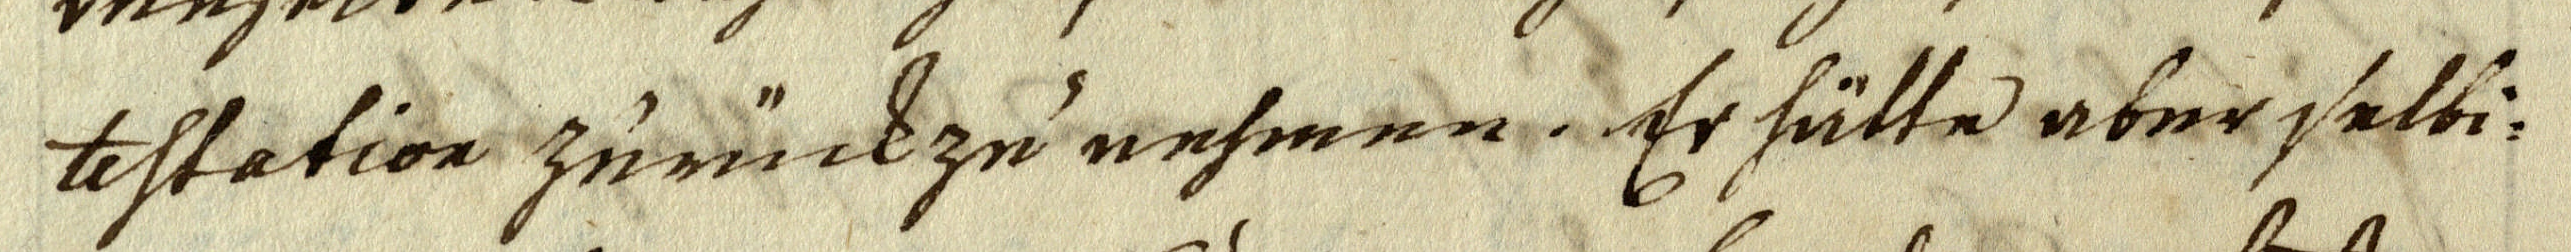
testation zurückzunehmen. Er hätte aber selbi¬
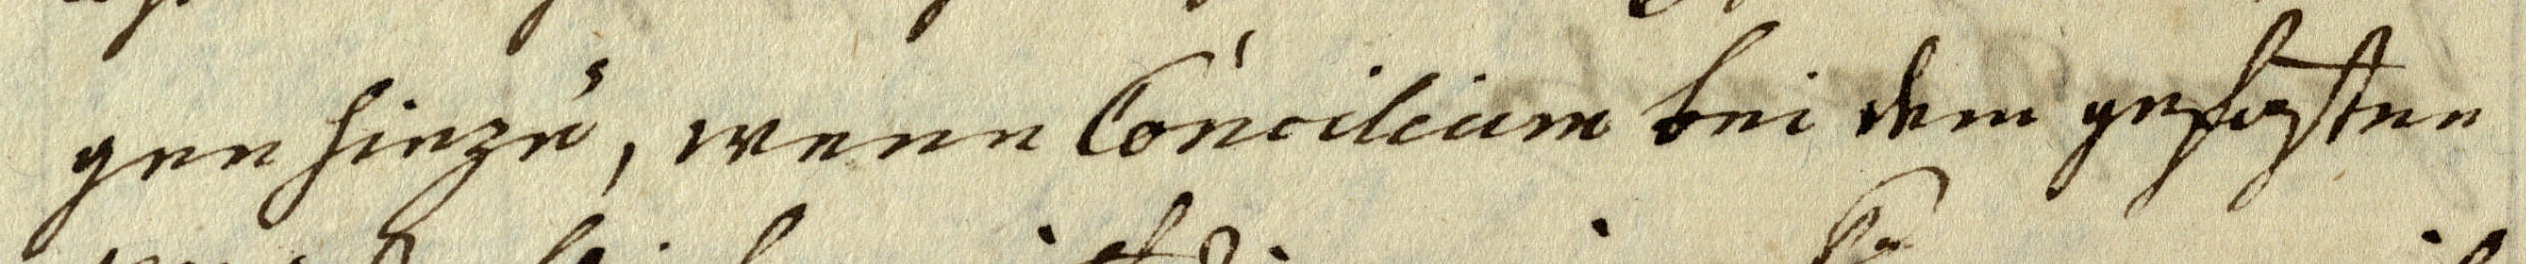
gen hiezu, wenn Concilium bei dem gefasten
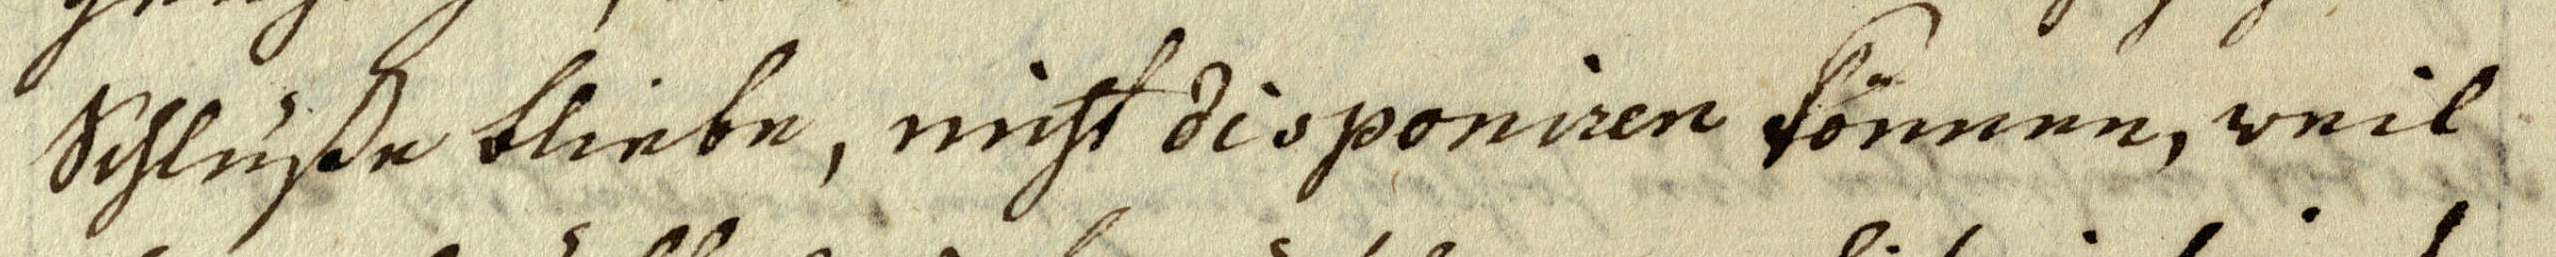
Schluße bliebe, nicht disponiren können, weil
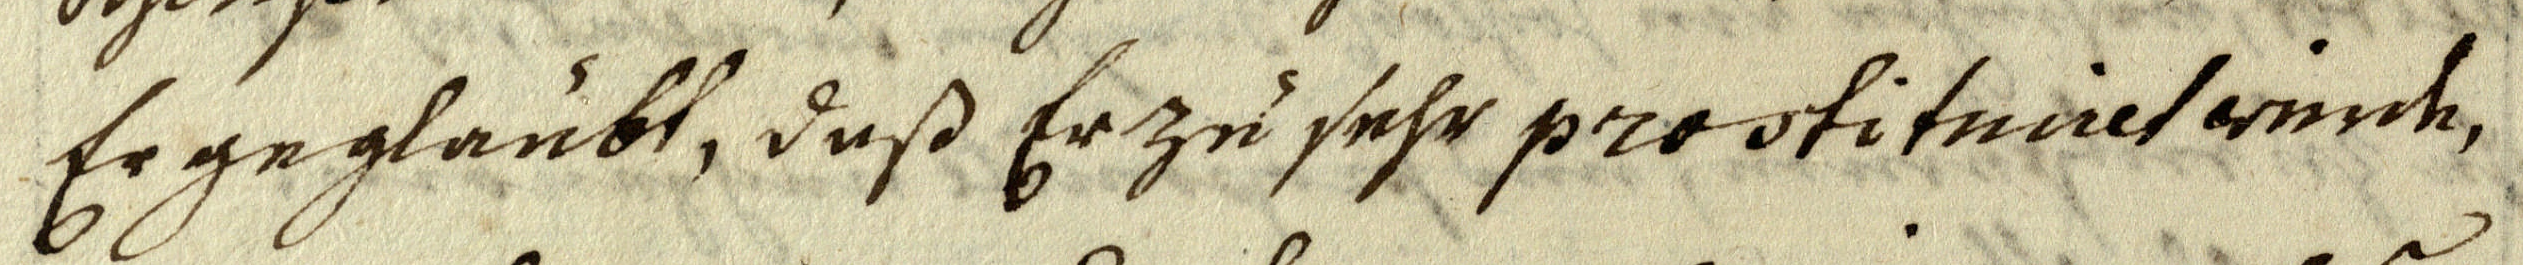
Er geglaubt, daß Er zu sehr prostituiret würde,
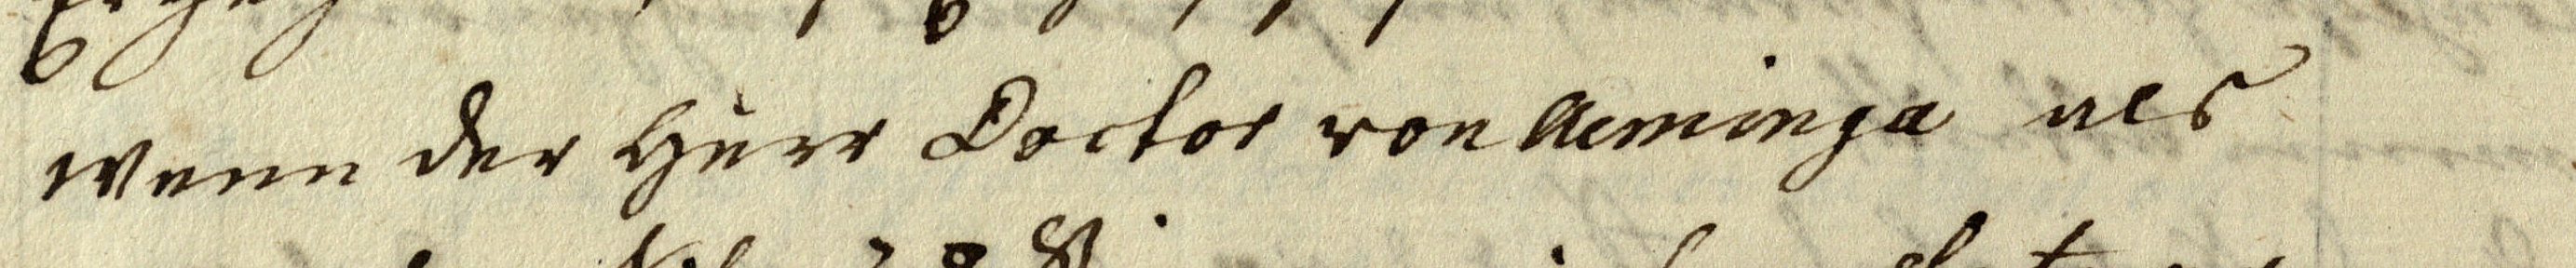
wenn der Herr Doctor von Aeminga als
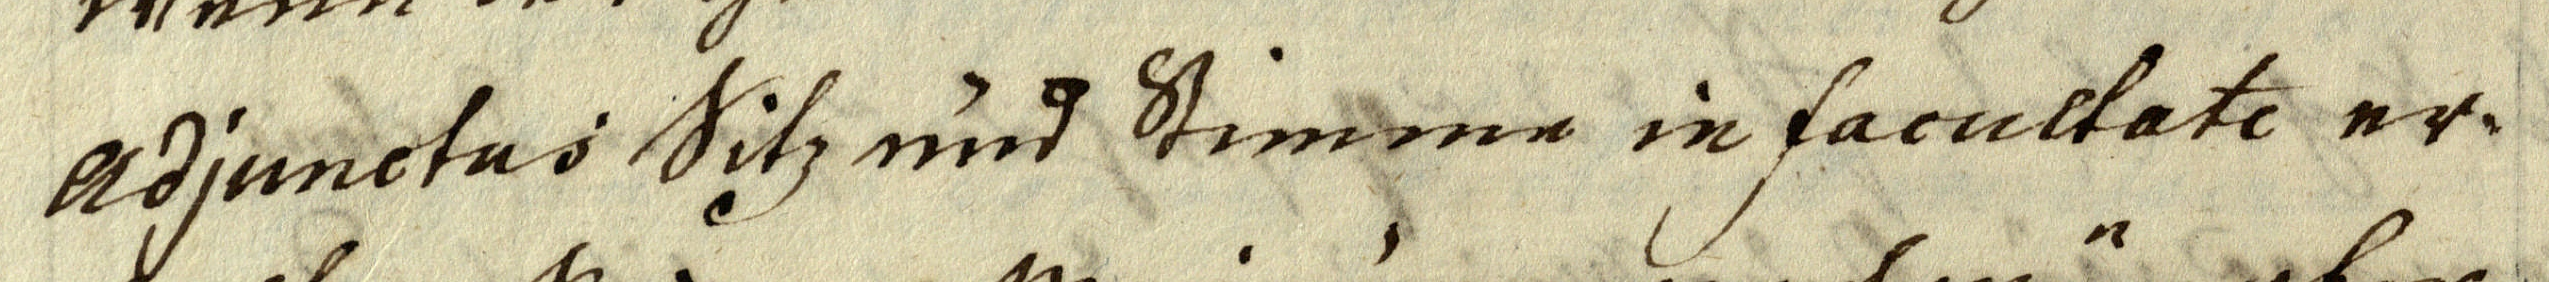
Ajunctus Sitz und Stimme in facultate er¬
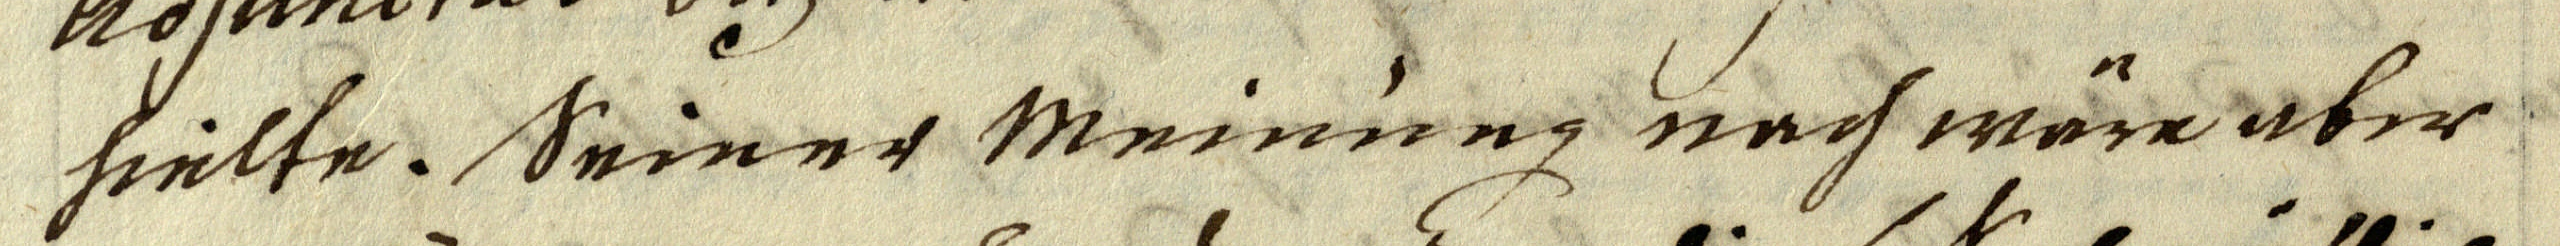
hielte. Seiner Meinung nach wäre aber
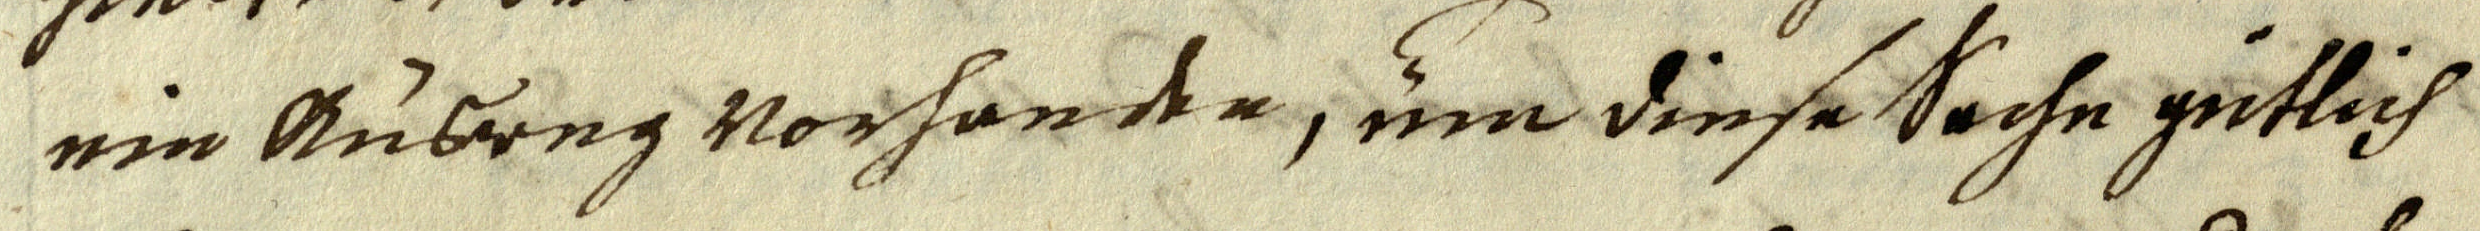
ein Ausweg vorhanden, um diese Sache gütlich
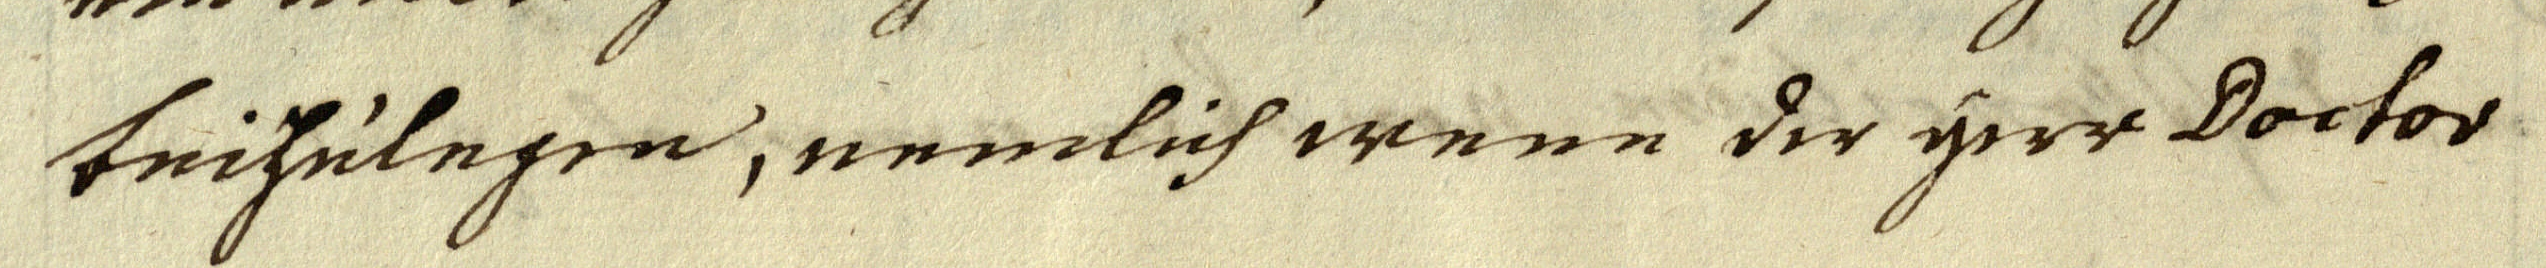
beizulegen, nemlich wenn der Herr Doctor
